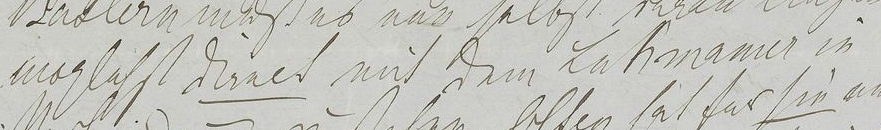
möglichst direct mit dem Lukmanier in
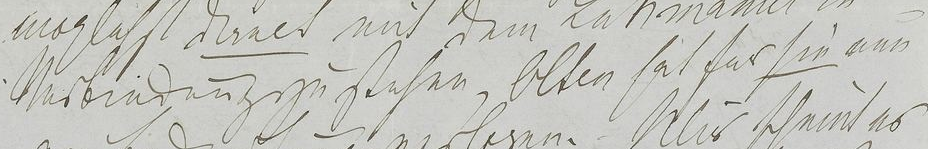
Verbindung zu stehen, Olten hat für sie nun
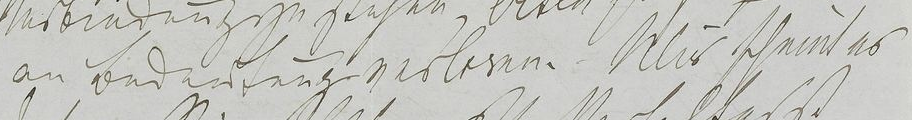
an Bedeutung verloren. Mir scheint es
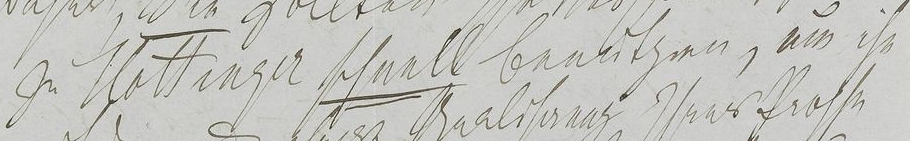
zu Hottingerschnell benützen, um ihn
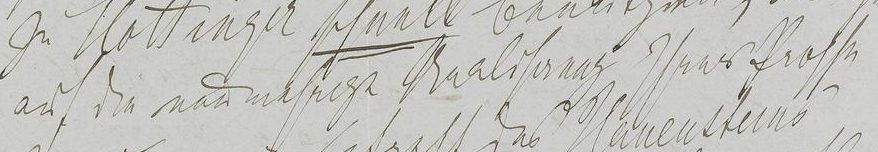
auf die nunmehrige Realisirung Ihrer Prophe-
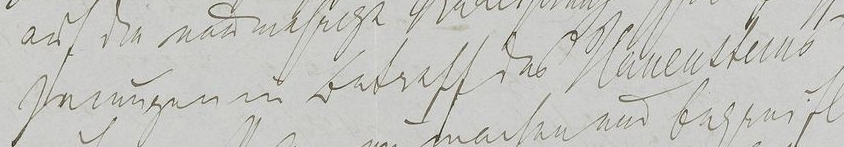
zeiungen in Betreff des Hauensteins
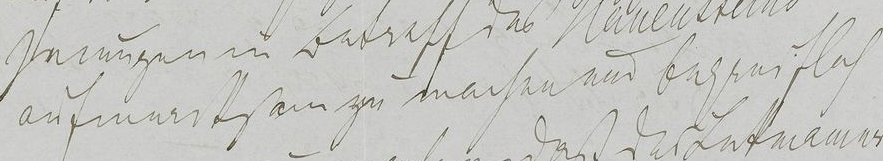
aufmercksam zu machen und begreiflich
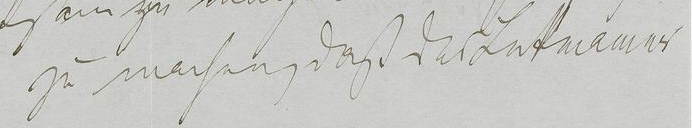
zu machen, daß der Lukmanier -
